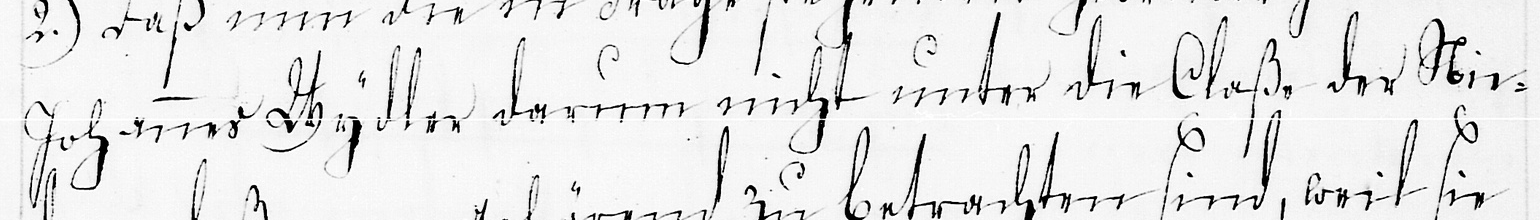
Johannes Wydler darum nicht unter die Claße der Nie¬
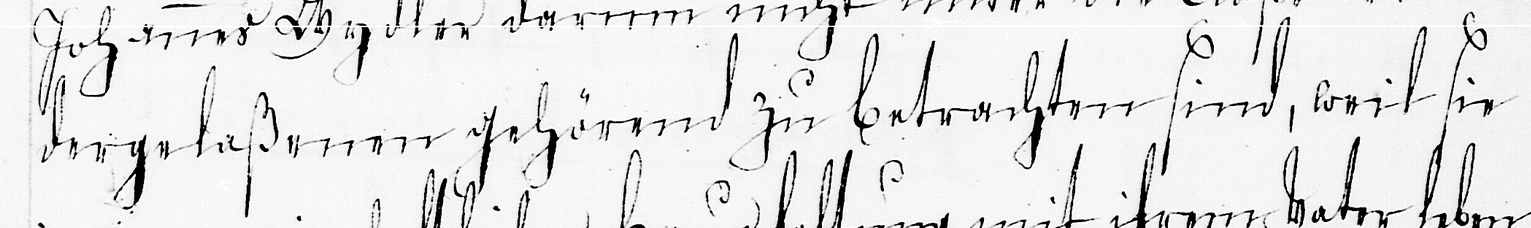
dergelaßenen gehörend zu betrachten sind, weil sie
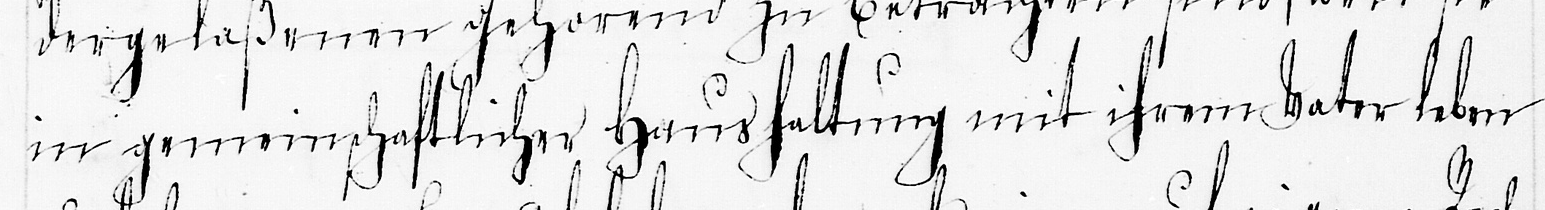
in gemeinschaftlicher Haushaltung mit ihrem Vater leben
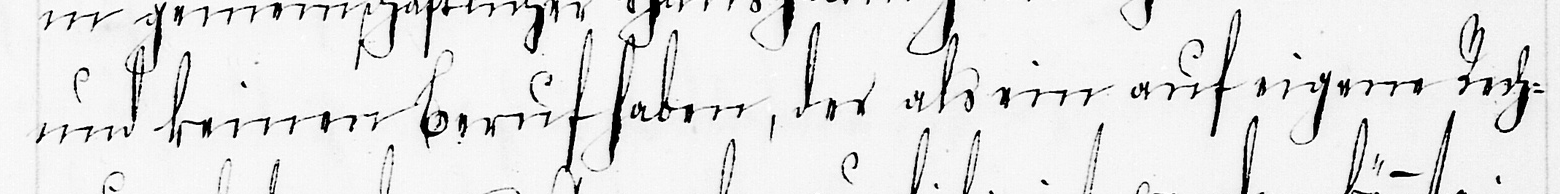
und keinen Beruf haben, der als ein auf eigene Rech¬
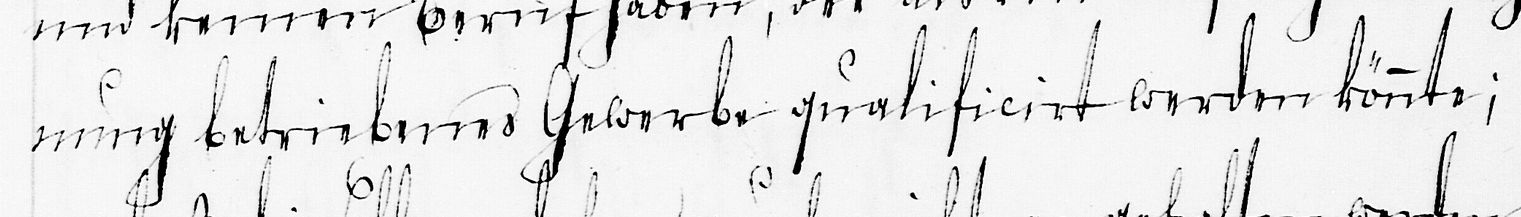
nung betriebenes Gewerbe qualificirt werden könnte;
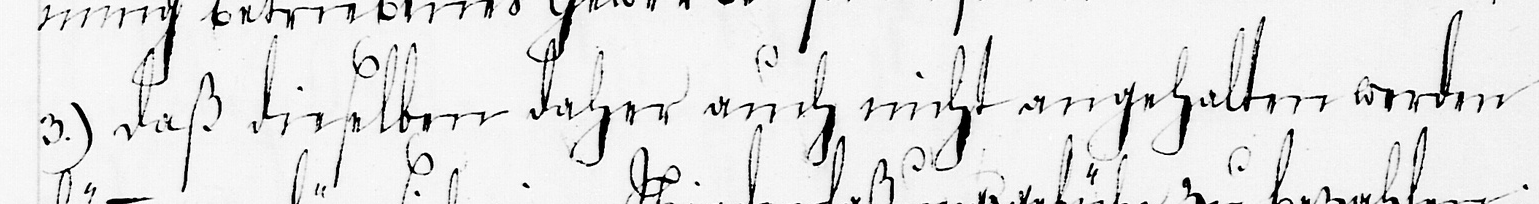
3.) Daß dieselben daher auch nicht angehalten werden
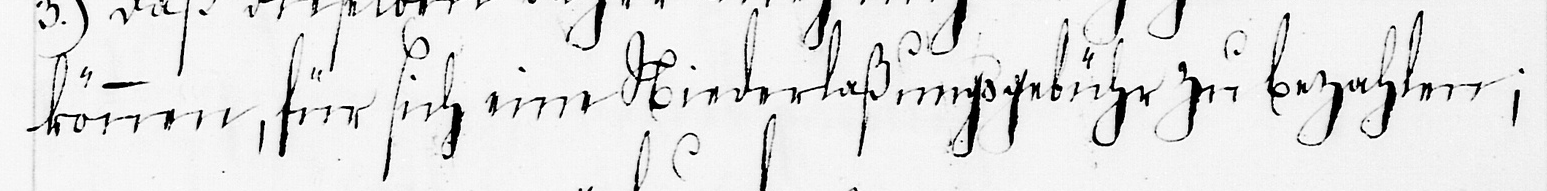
können, für sich eine Niederlaßungsgebühr zu bezahlen;
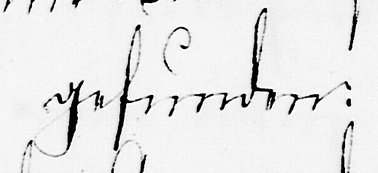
gefunden:
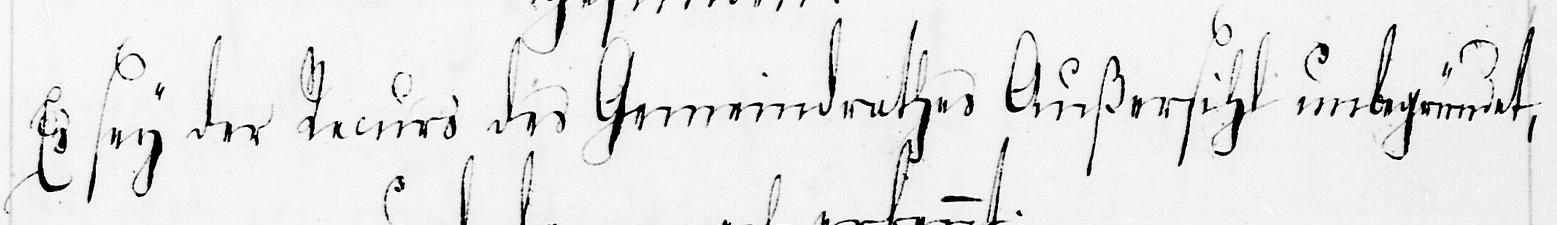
Es sey der Recurs des Gemeindrathes Außersihl unbegründet,
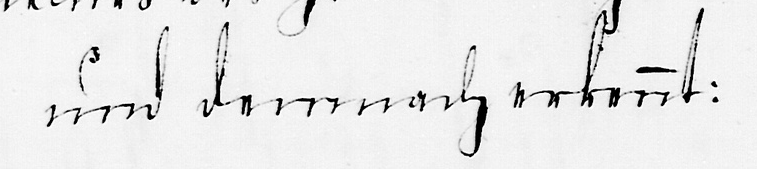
und demnach erkennt:
